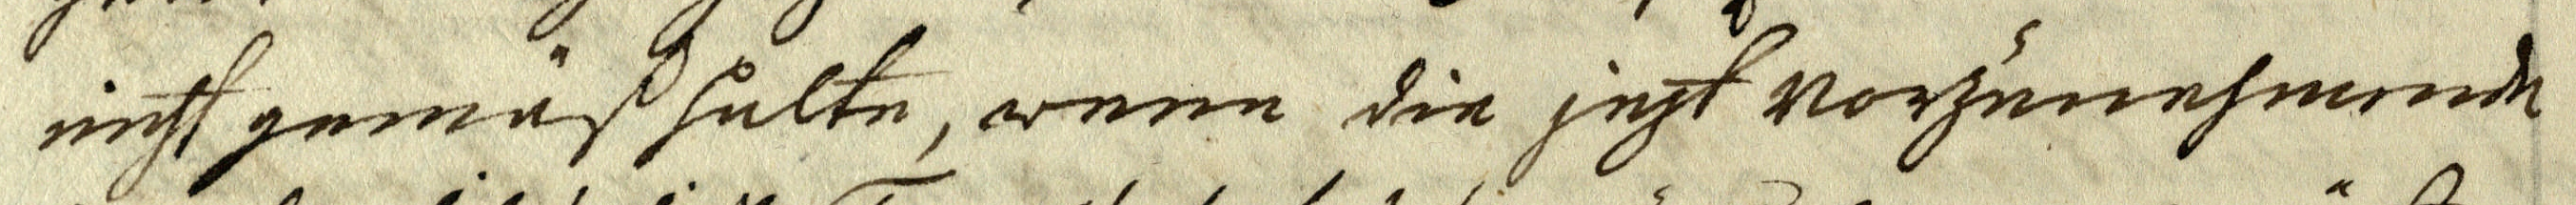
nicht gemäß halte, wenn die jezt vorzunehmende
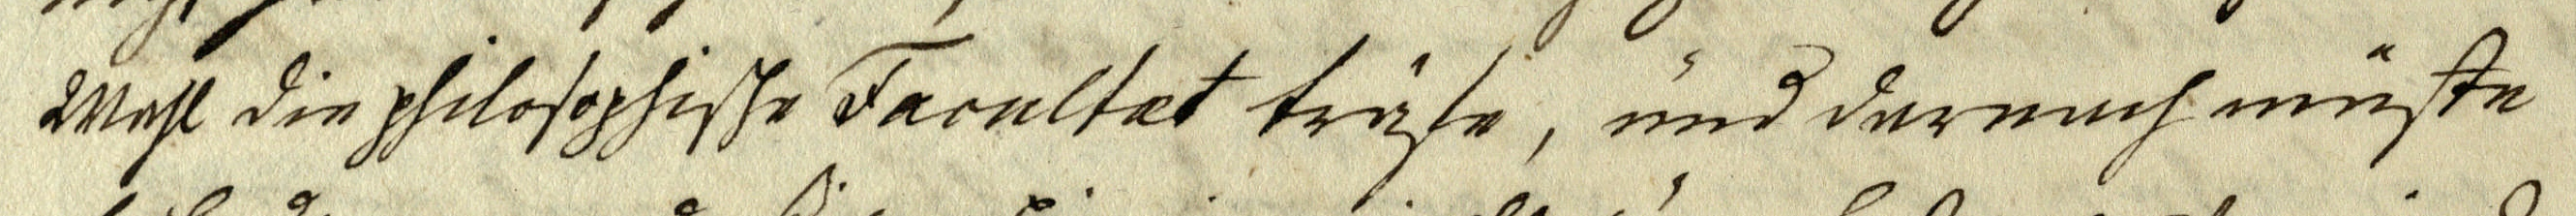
Wahl die philosophische Facultaet träfe, und darnach müste
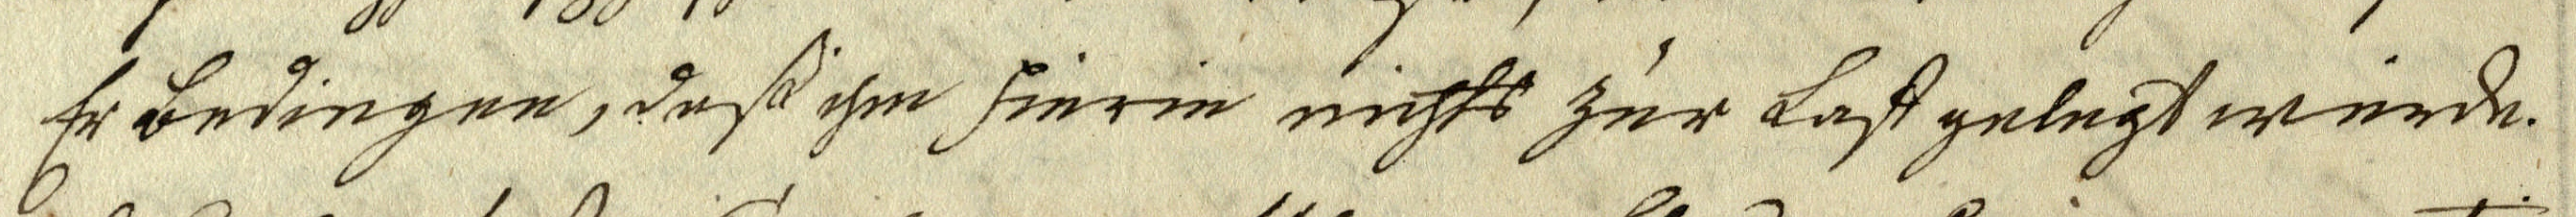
Er bedingen, daß ihm hierin nichts zur Last gelegt würde.
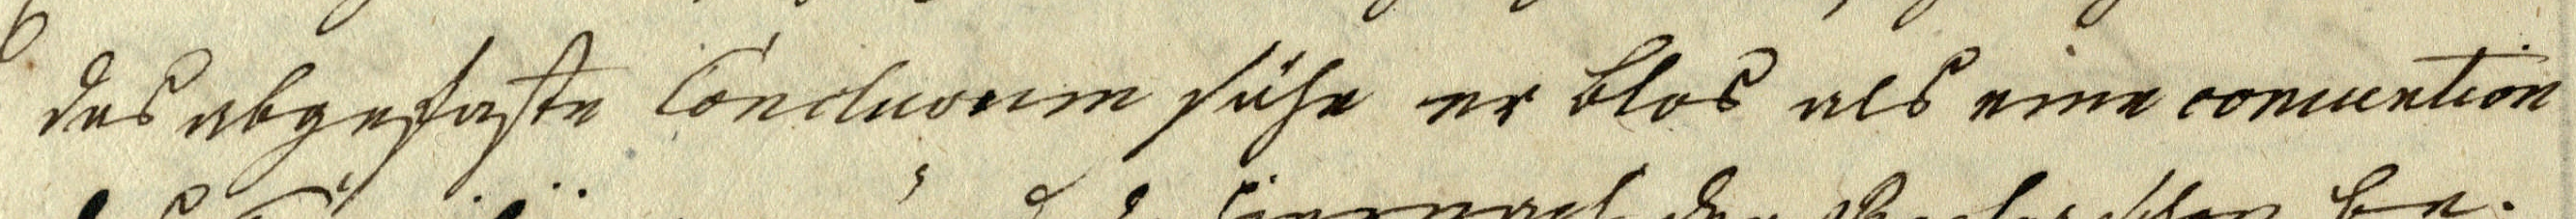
Das abgefaste Conclusum sähe er blos als eine comuntion
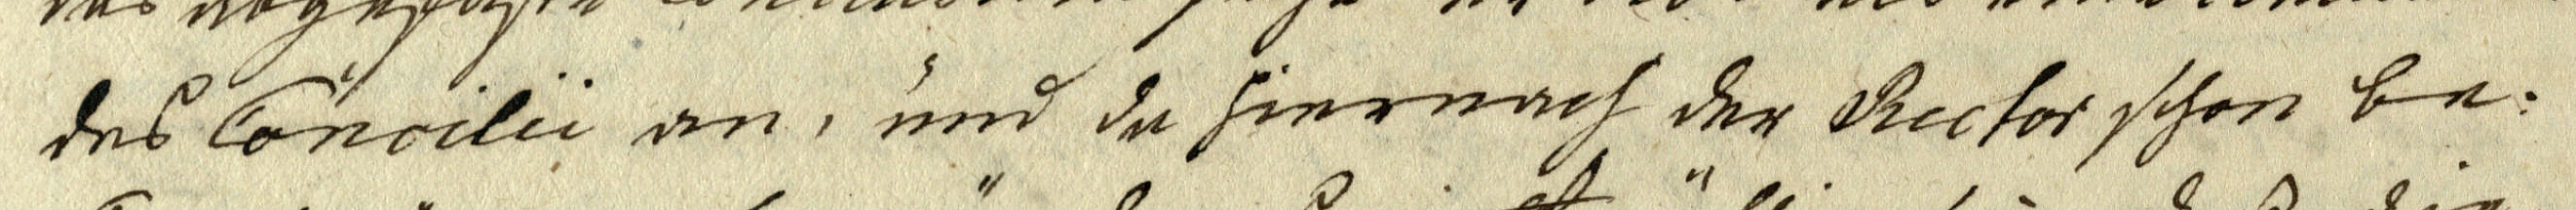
des Concilii an, und da hiernach der Rector schon be¬
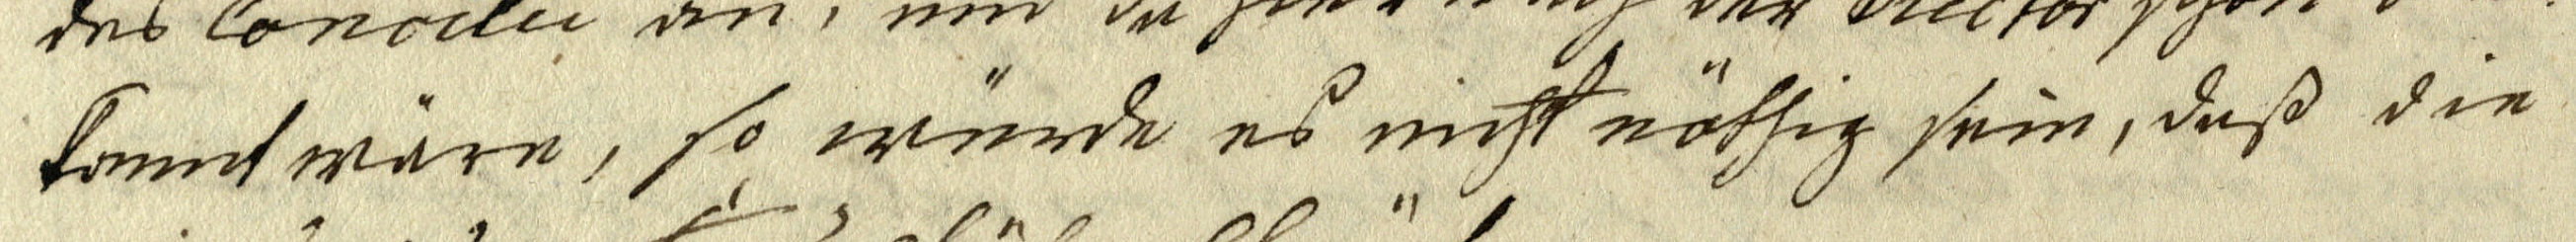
kannt wäre, so würde es nicht nöthig sein, daß die
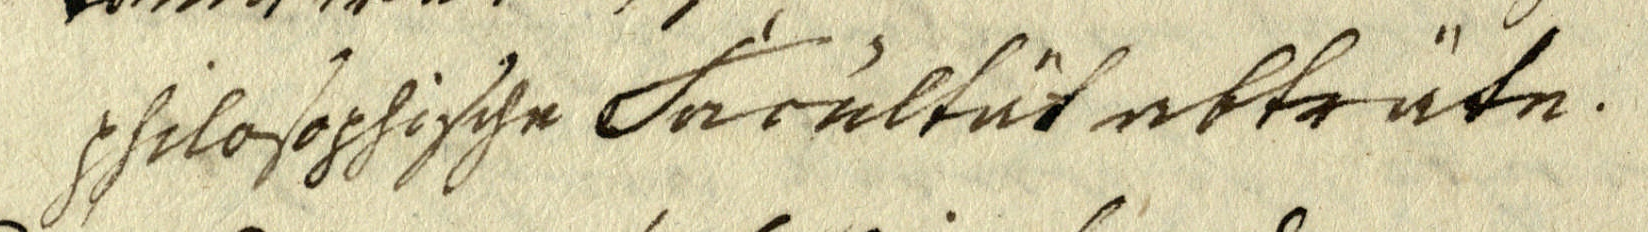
philosophische Facultät abträte.
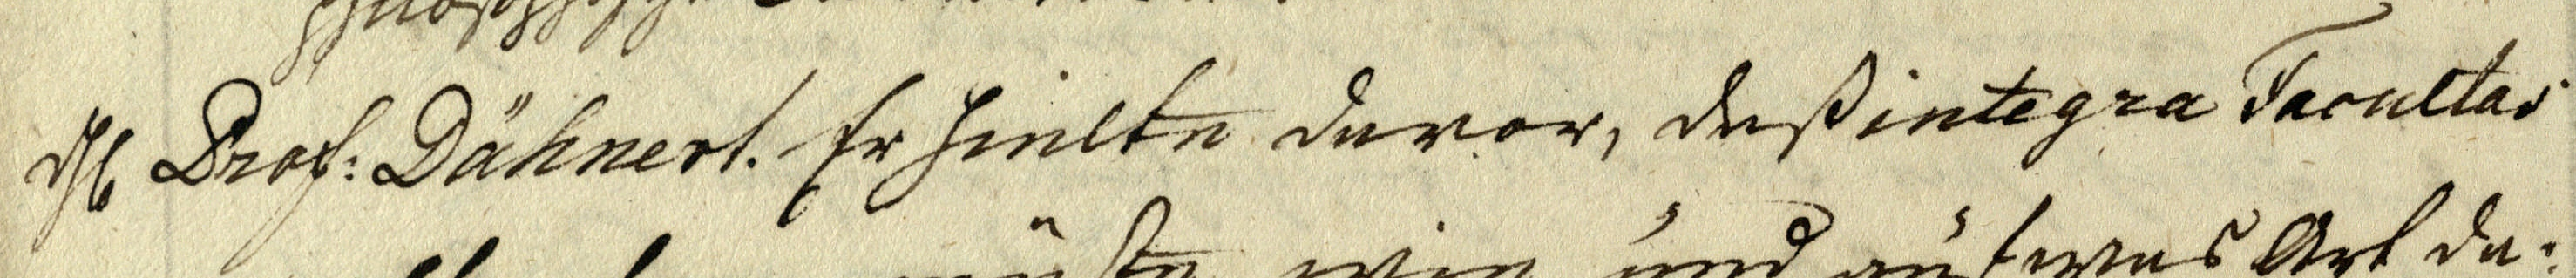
dh Prof. Dähnert. Er hielte davor, daß integra Facultas
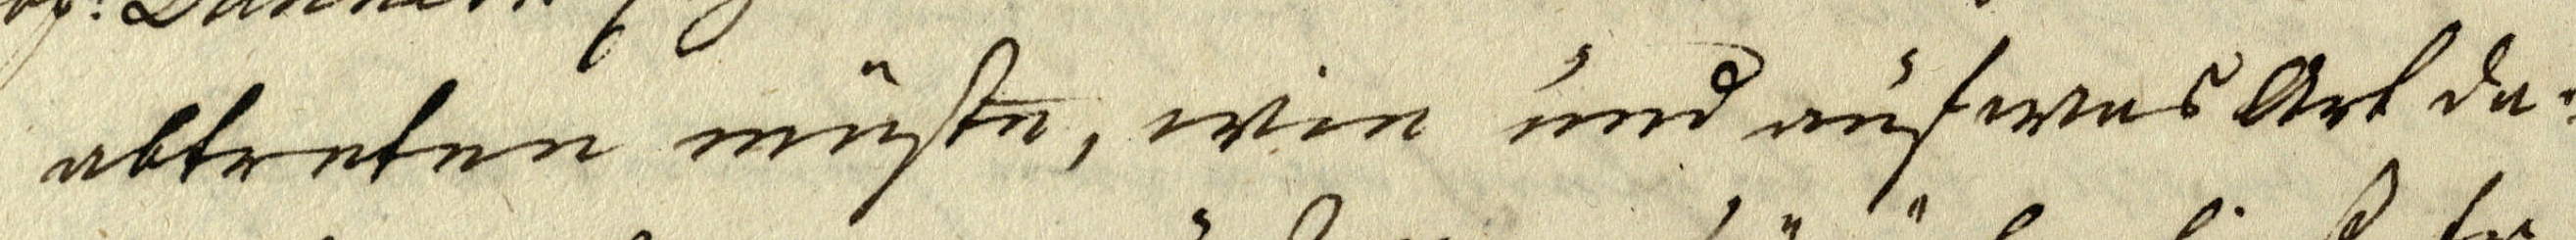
abtreten müste, wie und auf was Art da¬
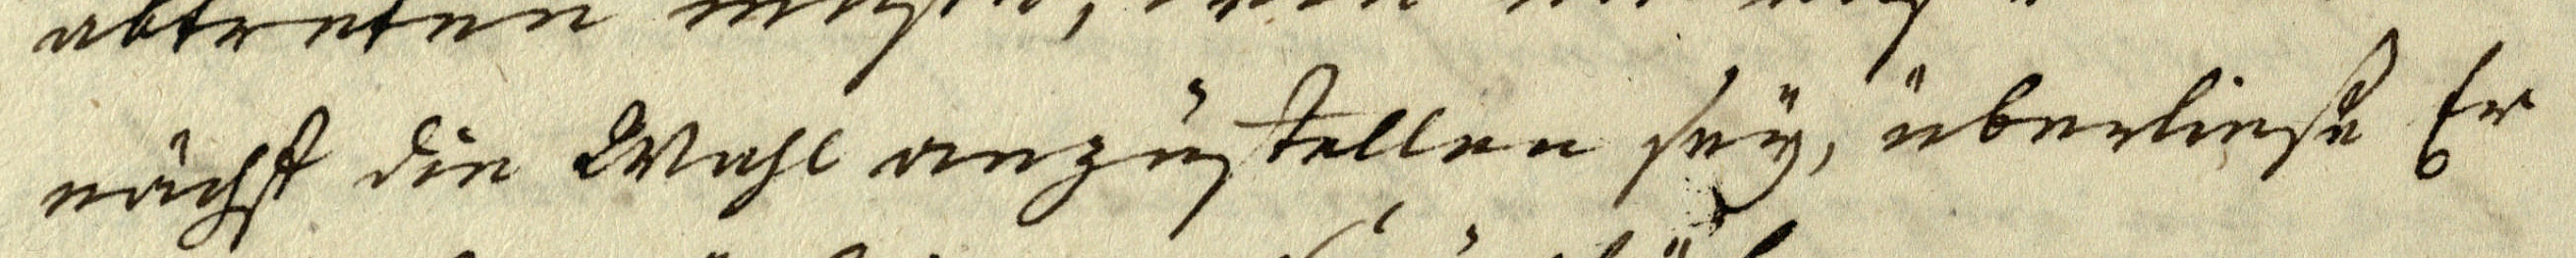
nächst die Wahl anzustellen seÿ, überließe Er
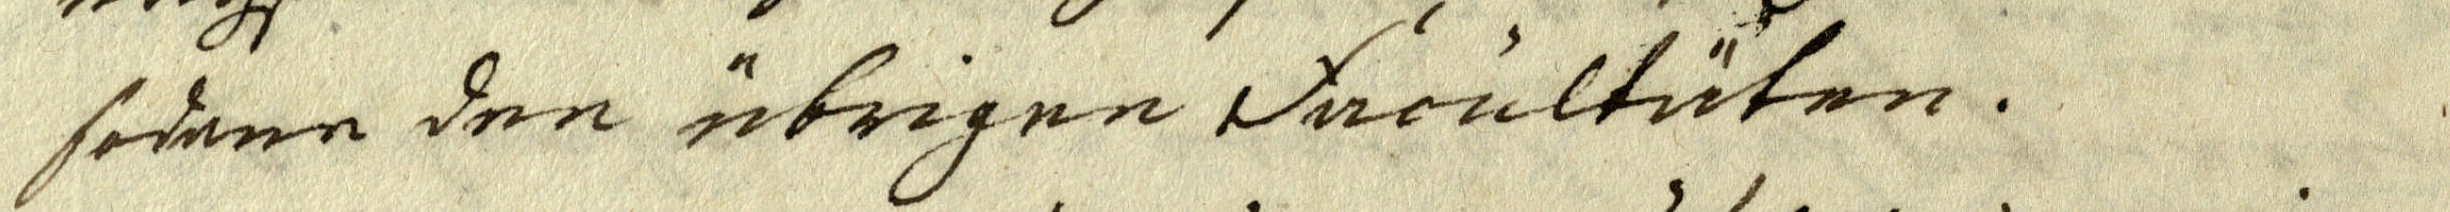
sodann den überigen Facultäten.
